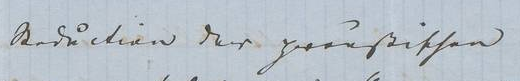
Reduction der preußischen
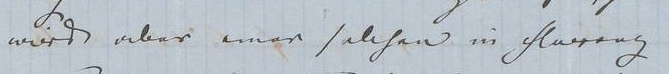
wird aber einer solchen in Florenz recht
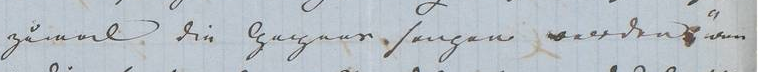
zumal die Gegner sagen werden «wen
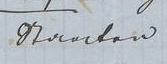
Staaten
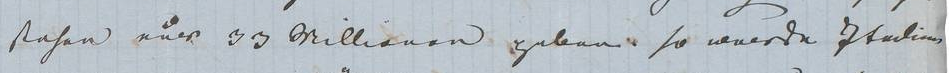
stehen nur 33 Millionen geben – so werde Italien
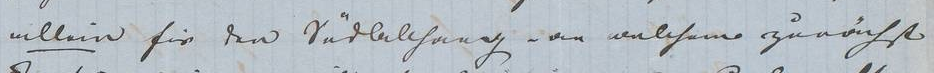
allein für den SüdAbhang – an welchem zunächst
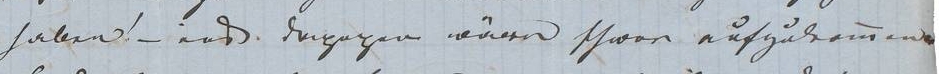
haben!» – und dagegen wäre schwer aufzukommen.
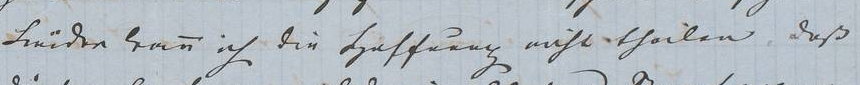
Leider kann ich die Hoffnung nicht theilen – daß
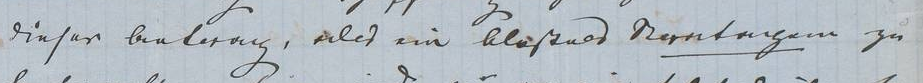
dieser Antrag, als ein bloßes Stratagem zu
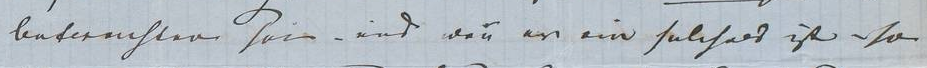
betrachten sei – und wenn es ein solches ist – so
